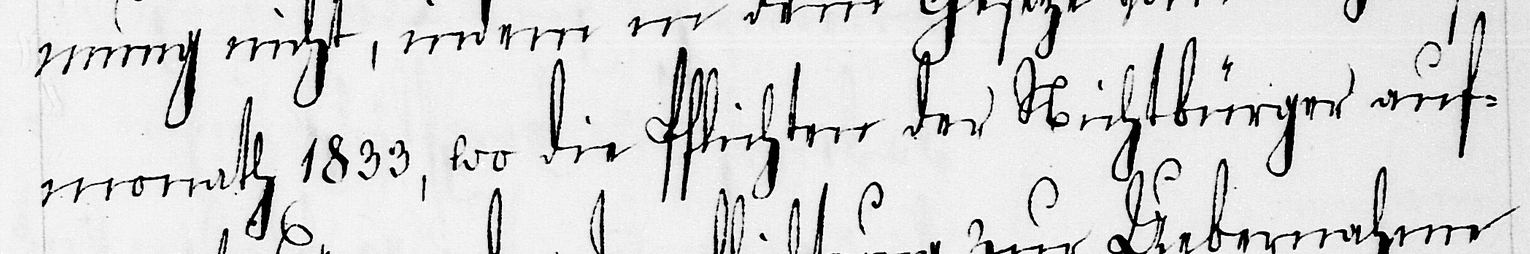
monath 1833, wo die Pflichten der Nichtbürger auf¬
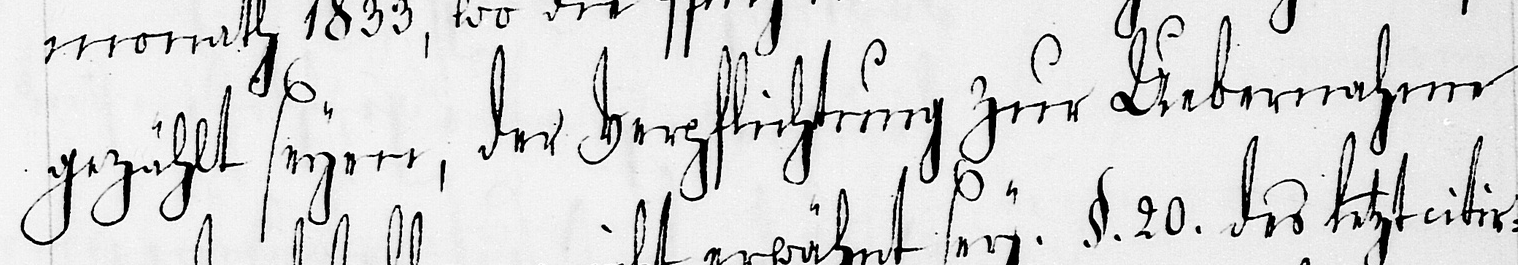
gezählt seyen, der Verpflichtung zur Uebernahme
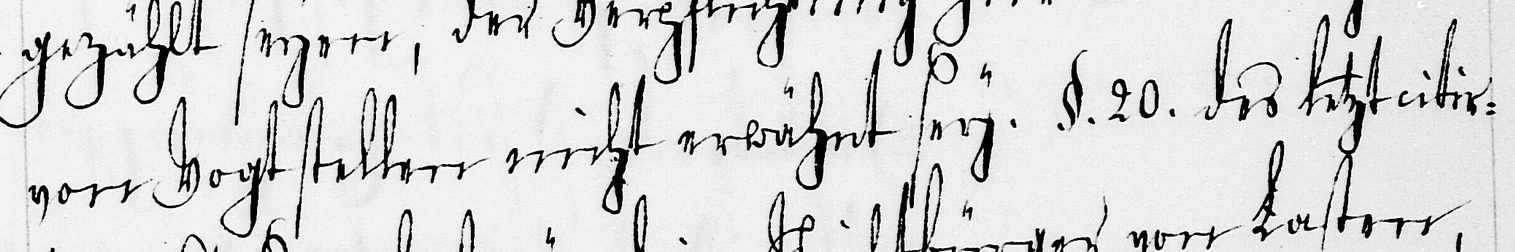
von Vogstellen nicht erwähnt sey. §. 20. des letzt ci¬
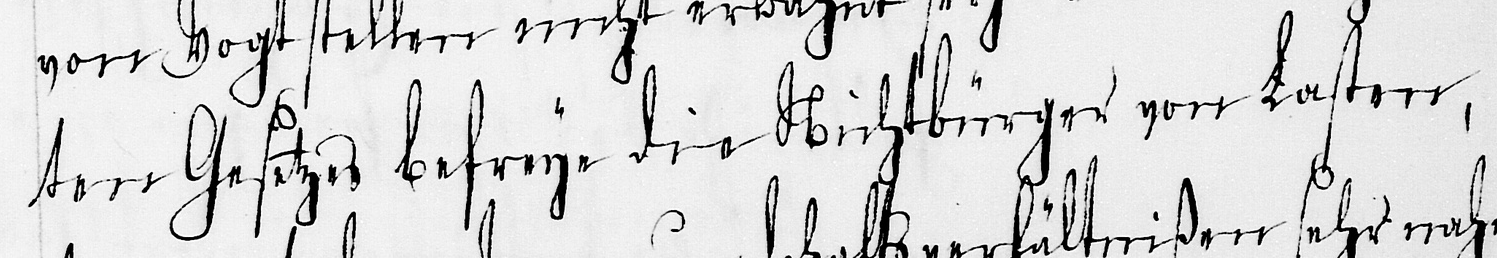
rten Gesetzes befreye die Nichtbürger von Lasten,
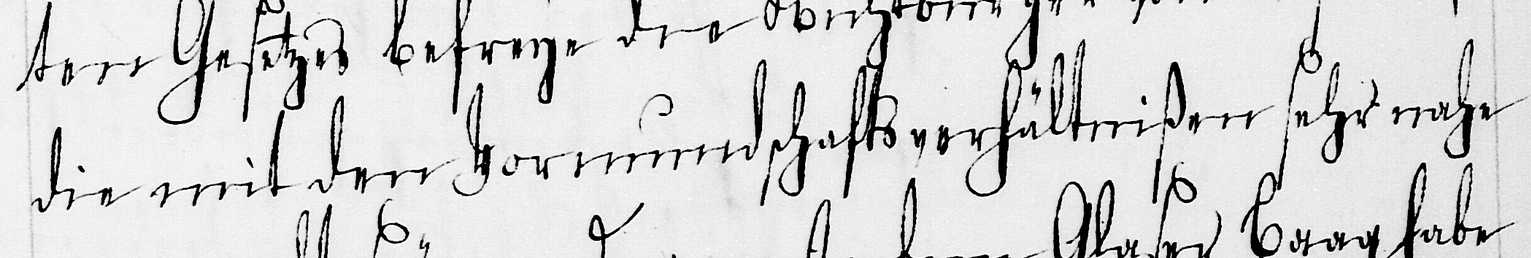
die mit den Vormundschaftsverhältnißen sehr nahe
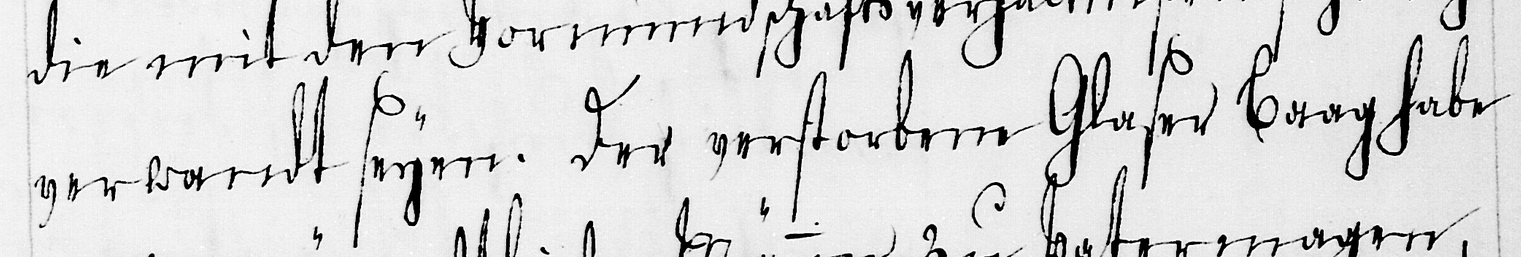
verwandt seyen. Der verstorbene Glaser Baag habe
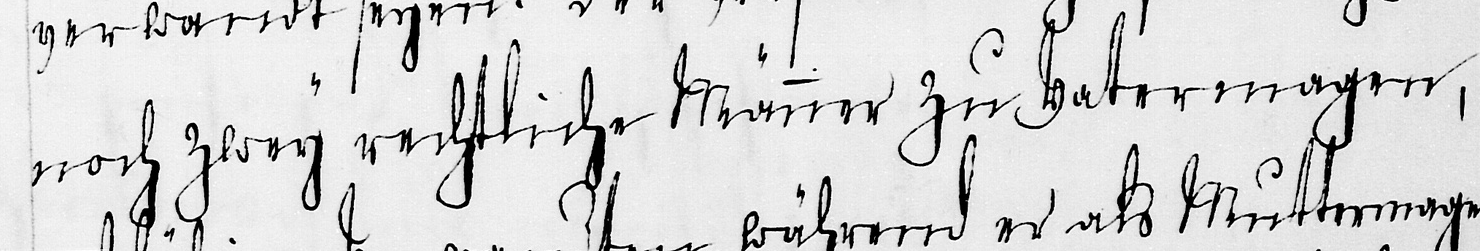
noch zwey rechtliche Männer zu Vatermagen,
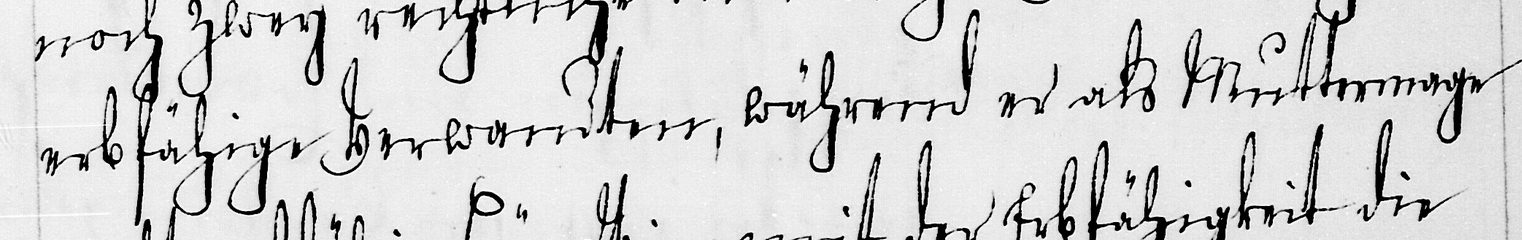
erbfähige Verwandten, während er als Muttermage
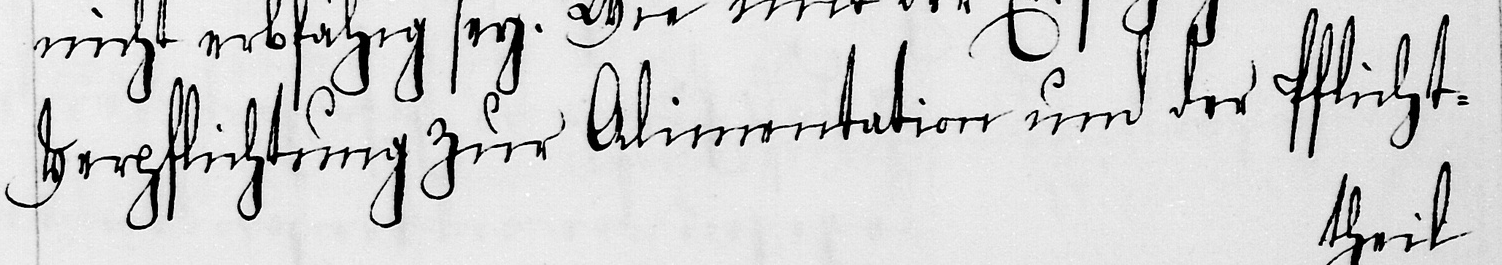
Verpflichtung zur Alimentation und der Pflicht-
